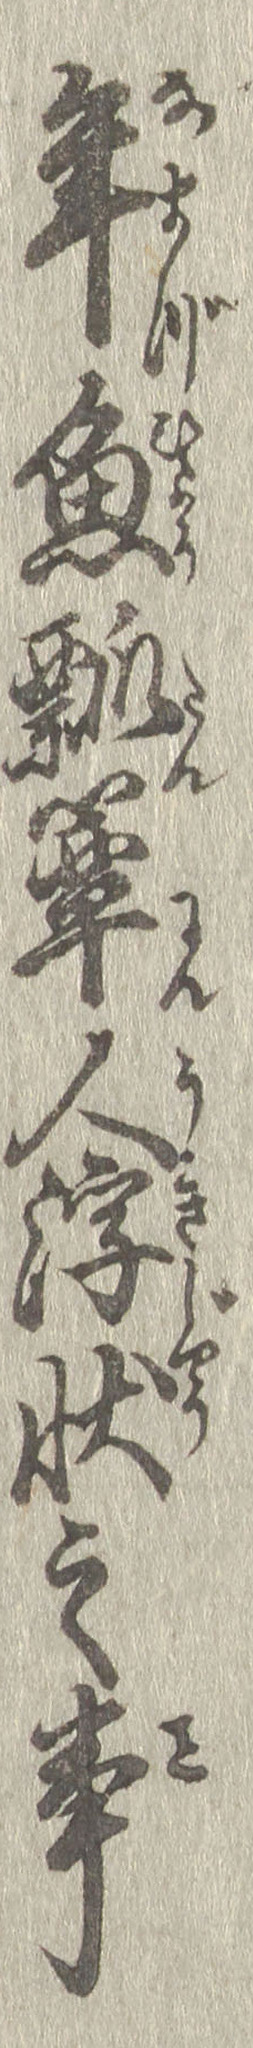年魚瓢箪人浮状之事
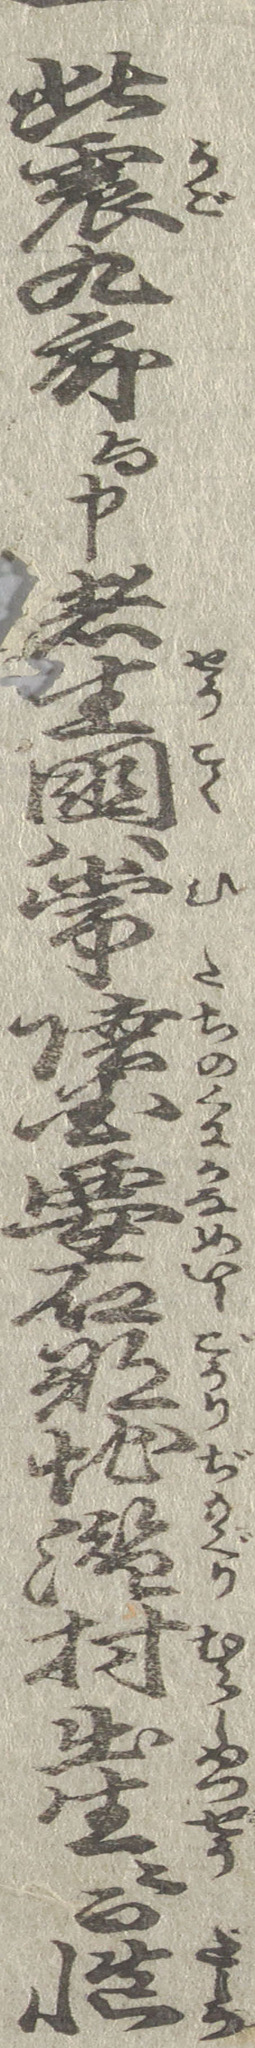一此震九郎と申者生国ハ常陸国要石郡地潜村出生ニ而慥
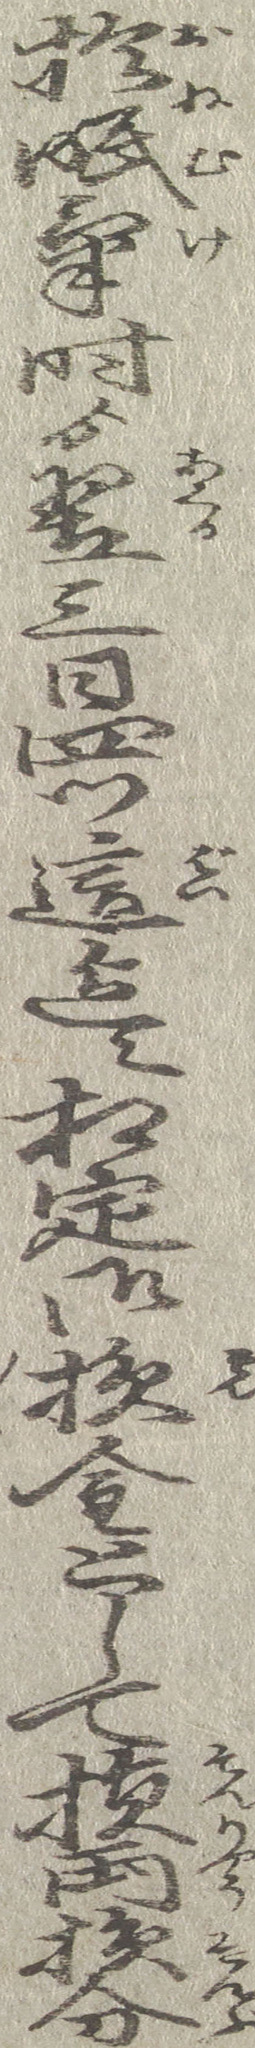於眠氣時ゟ翌三日四ツ這迄ニ相定御損金として損両損分
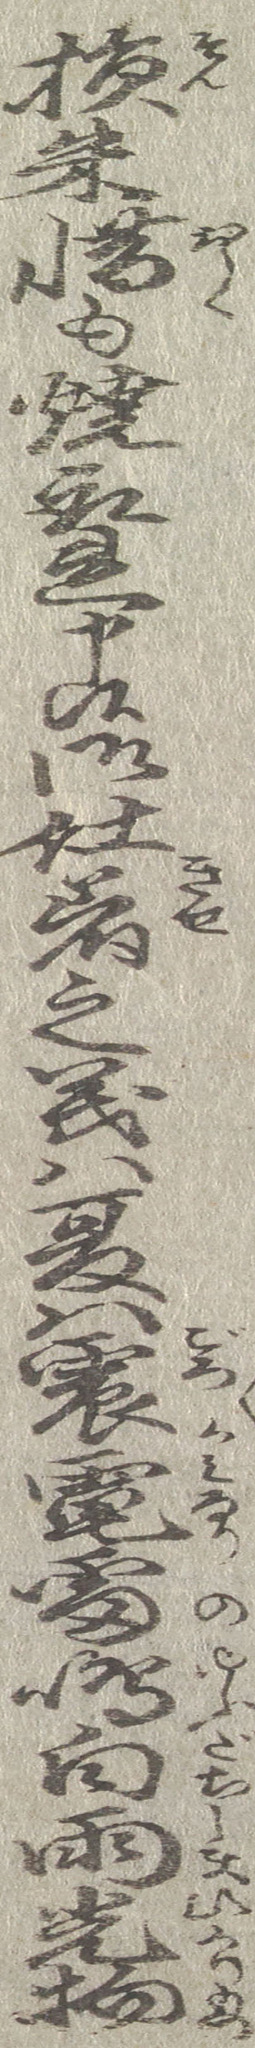損朱惜も焼取れ申候御仕着之義ハ夏ハ震電雷鳴白雨光物
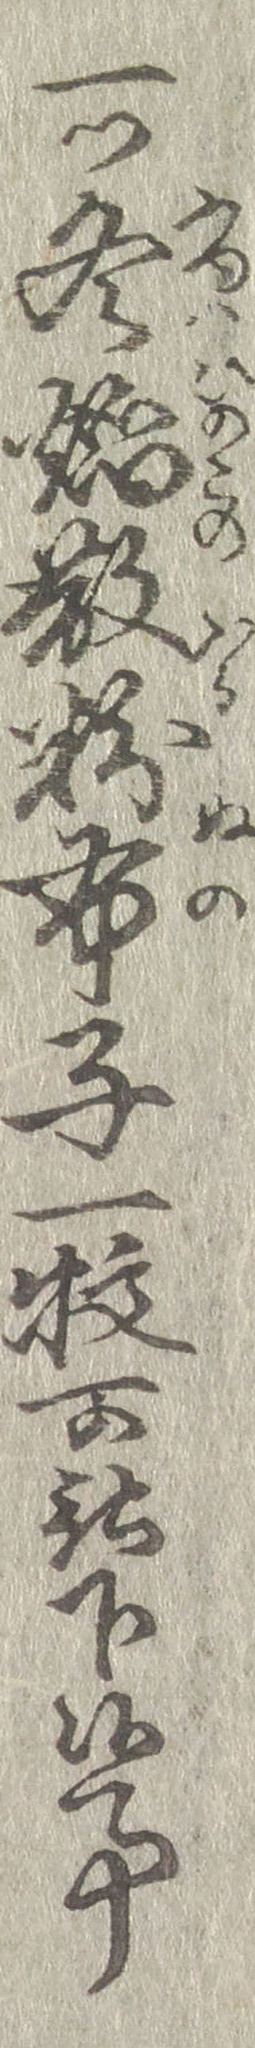一ツ冬焔散粉布子一枚可被下候事
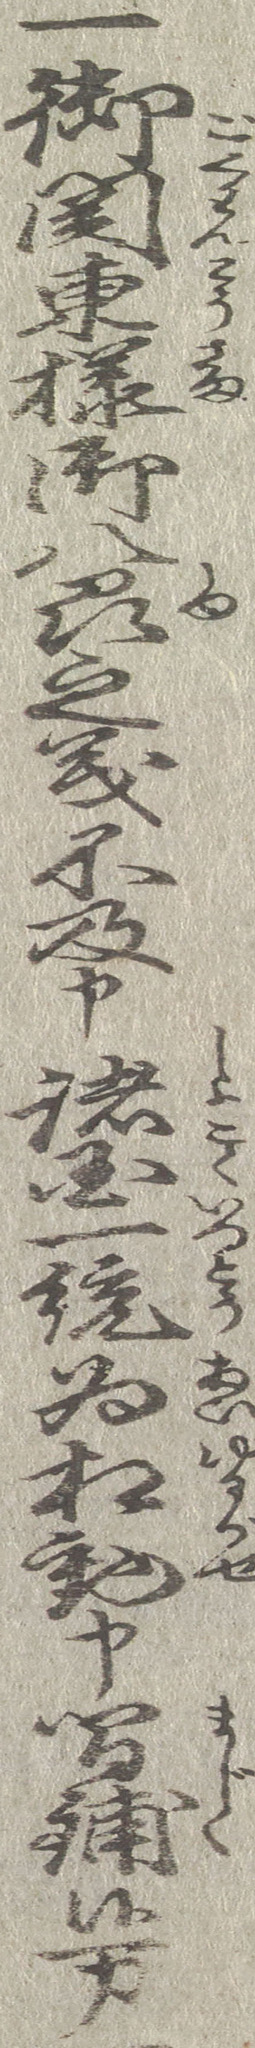一御関東様御八州之義不及申諸国一統為相動申間鋪候万一
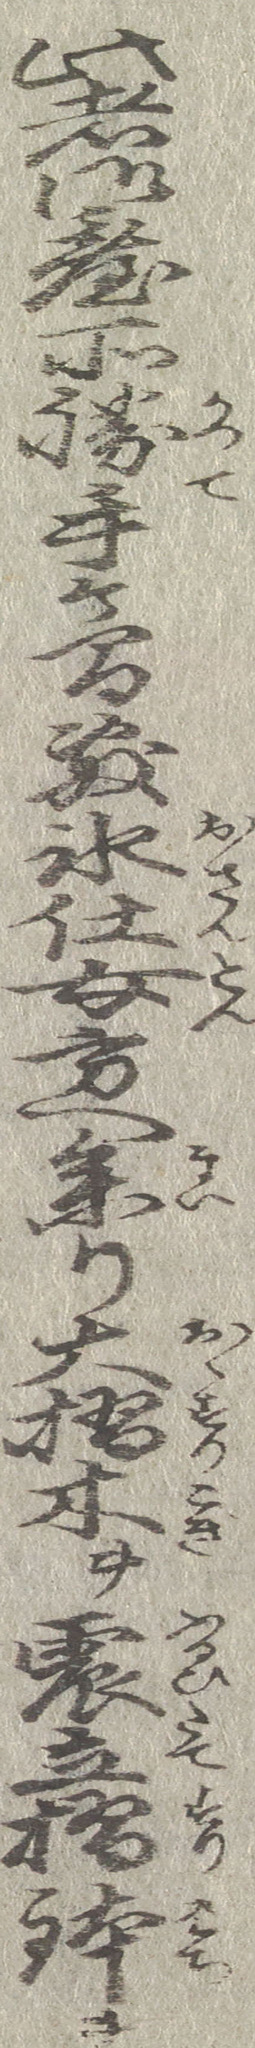此者御臺所勝手ケ間敷氷仕女方へ参り大摺木ヲ震立摺鉢ヲ
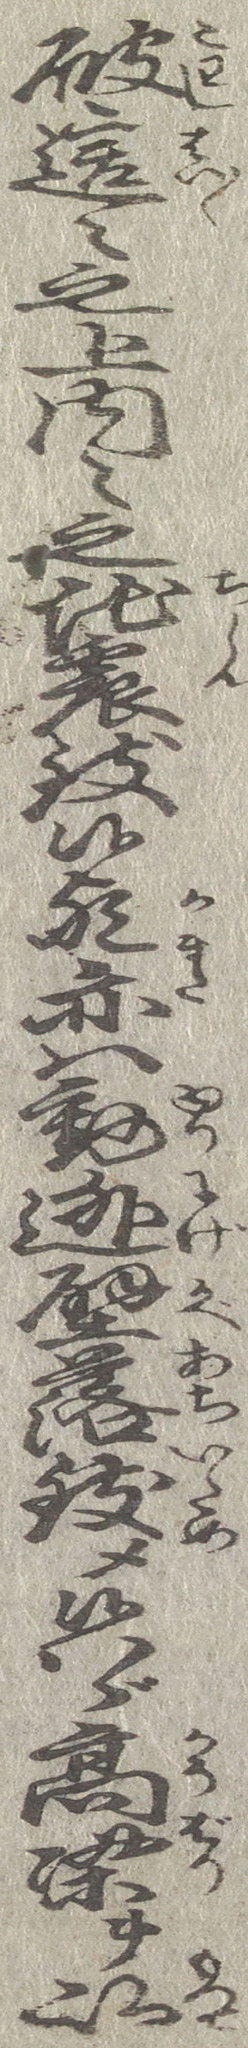破這々之上内々之地震致候欤亦ハ動迯壁落致メ候ハヾ高梁ヲ以
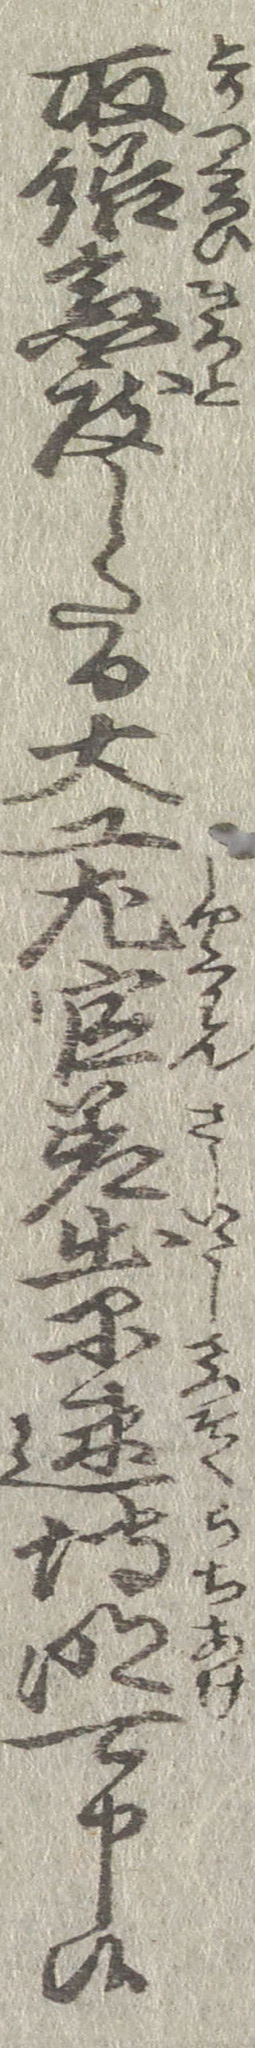取繕急度したる大工左官差出早速埒明可申候
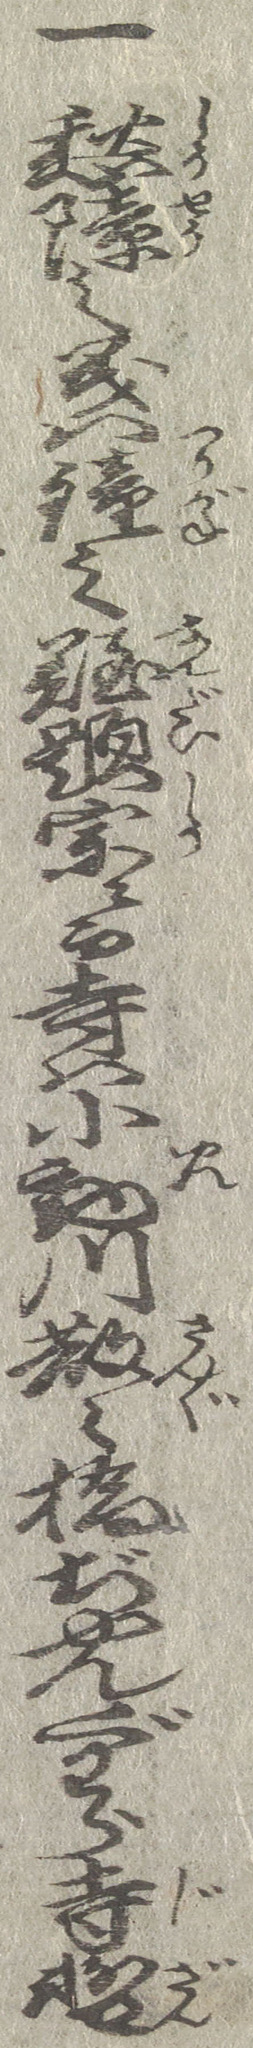一愁障之義ハ鐘之難題宗ニ而寺ハ小動川散々橋ぢやんぐわら寺暫
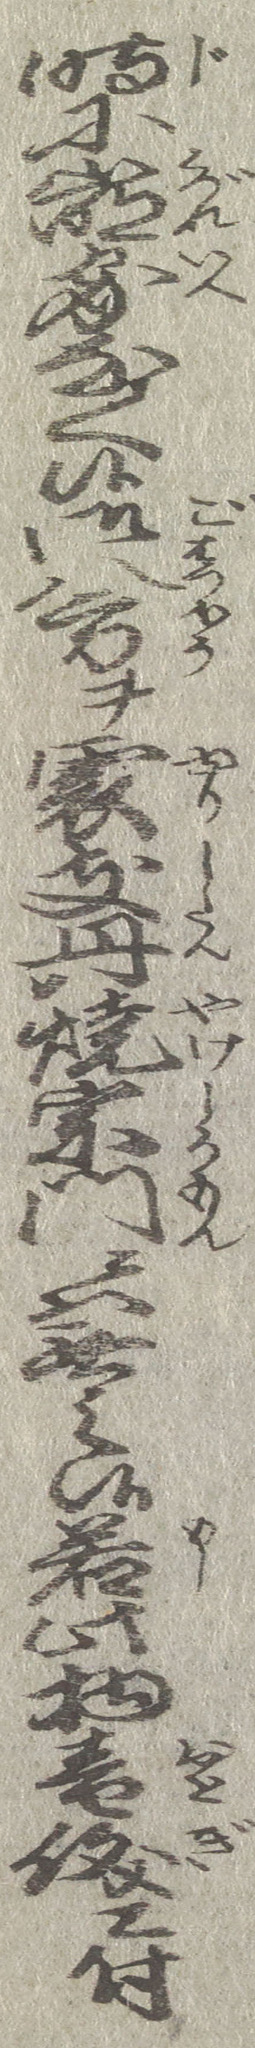時に崩家なく候御八方ヲ震支丹焼宗門ニハ無之候若此物音儀ニ付
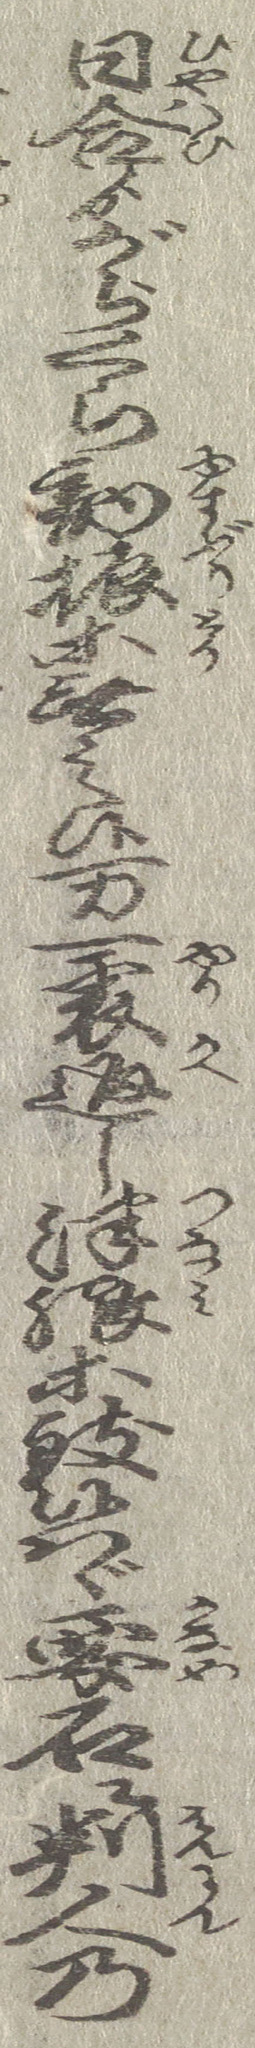日合ゟがらくら動振等無之候万一震返し津浪等致候ハヾ要石ニ判人乃
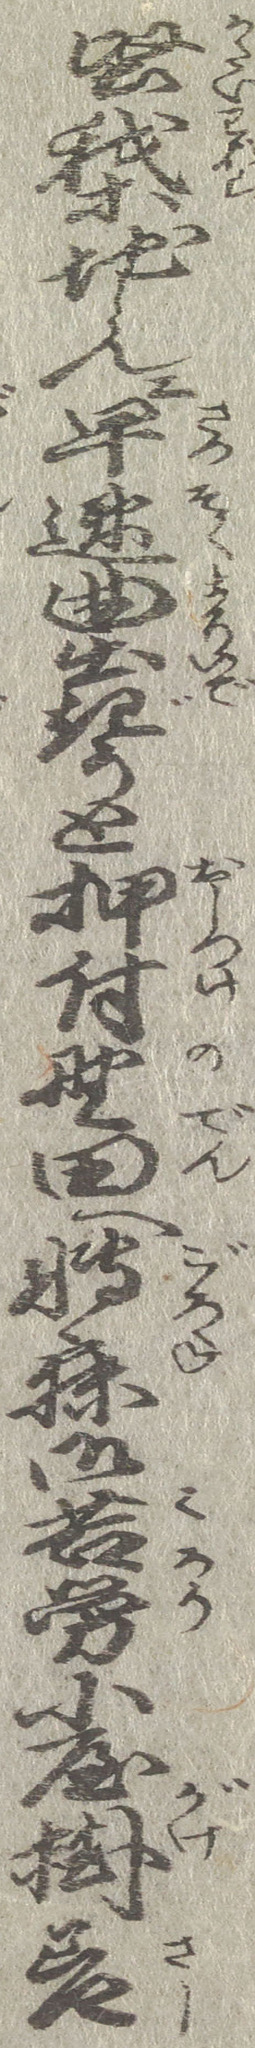堅我等地しんニ早速曲出ぎうと押付野田へ轉寐御苦労小屋掛差
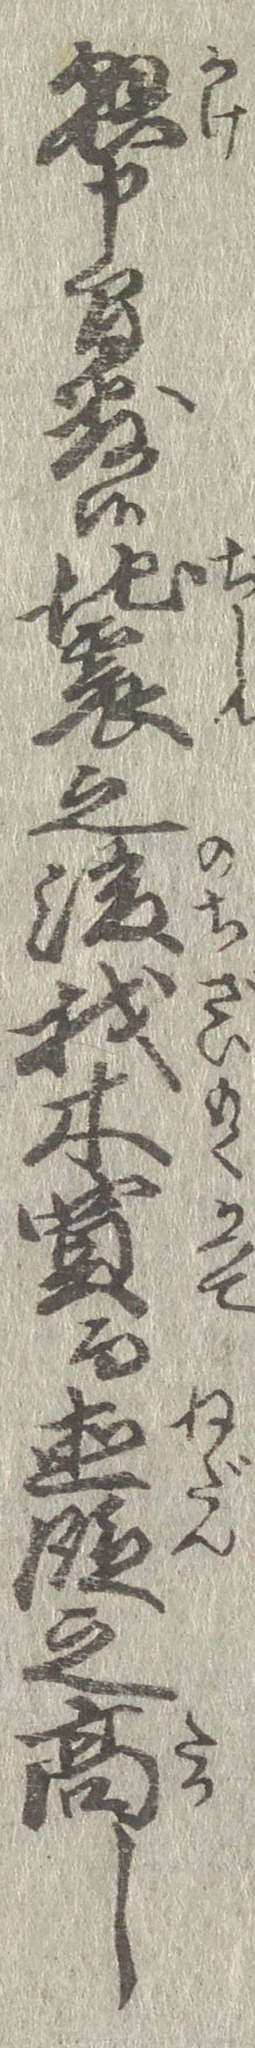懸申間敷候地震之後材木買而直段之高し
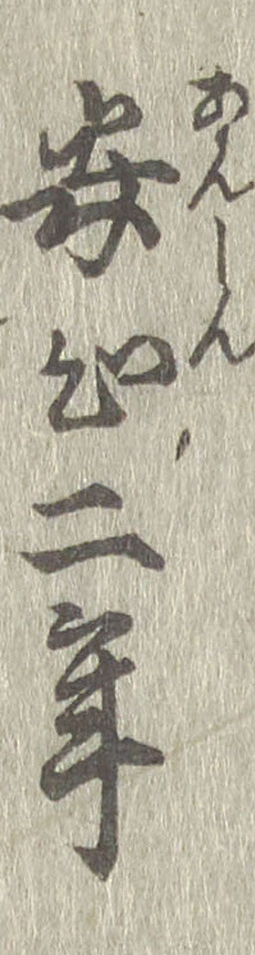安心二年
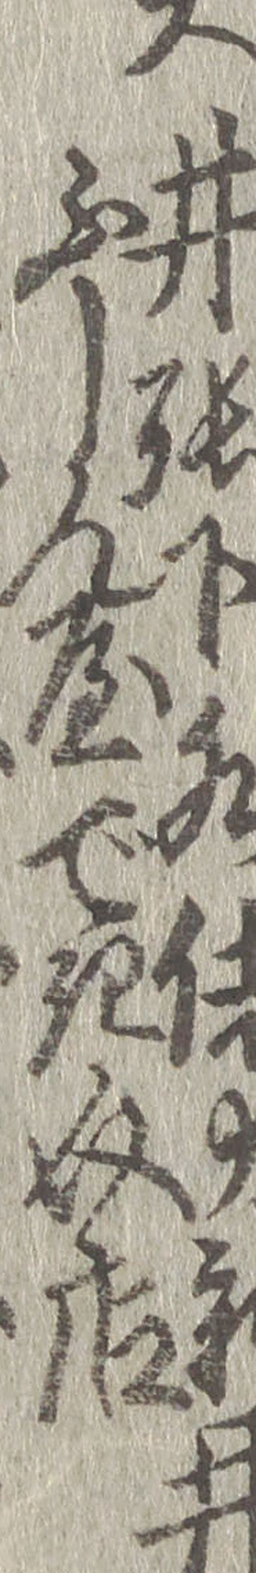ふしん屋でき介店
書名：年魚瓢箪人浮状之事
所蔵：東京大学総合図書館 General Library in the University of Tokyo, JAPAN
